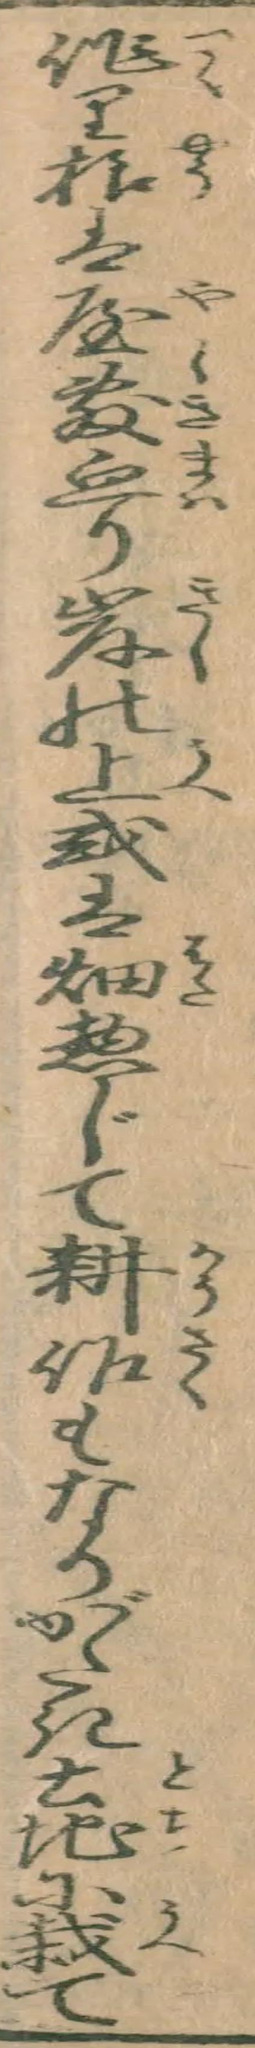作り様は屋敷廻り岸の上或は畑惣じて耕作もなりがたき土地に栽て
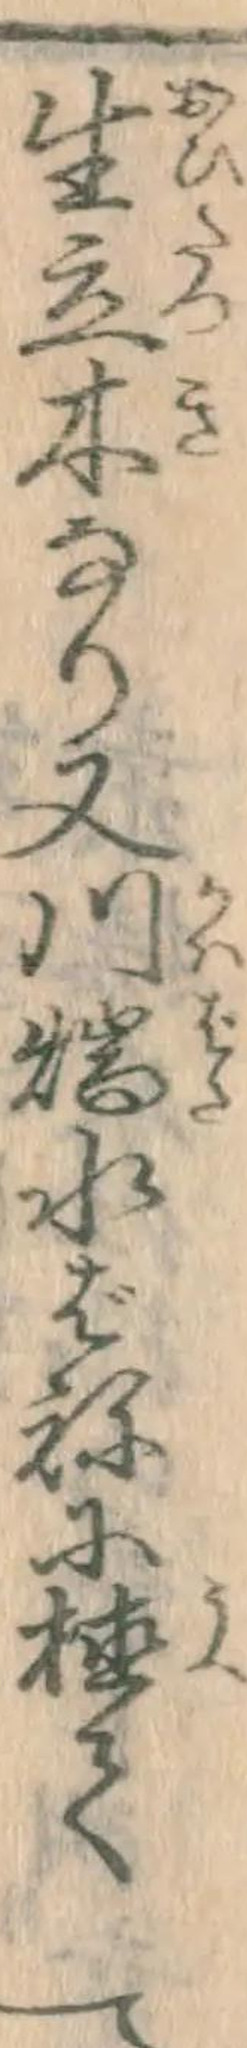生立木なり又川端水ばねに植て
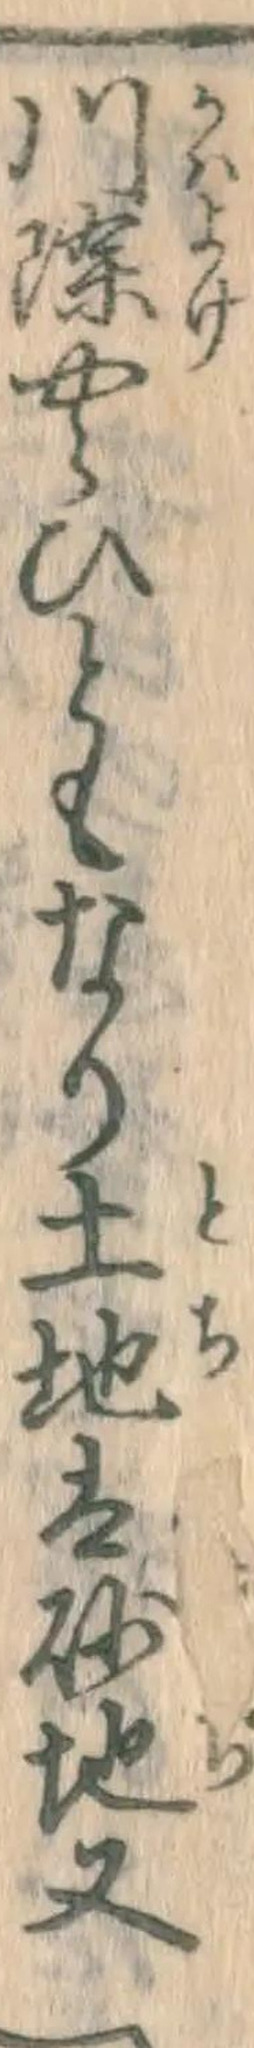川除やらひともなり土地は砂地又
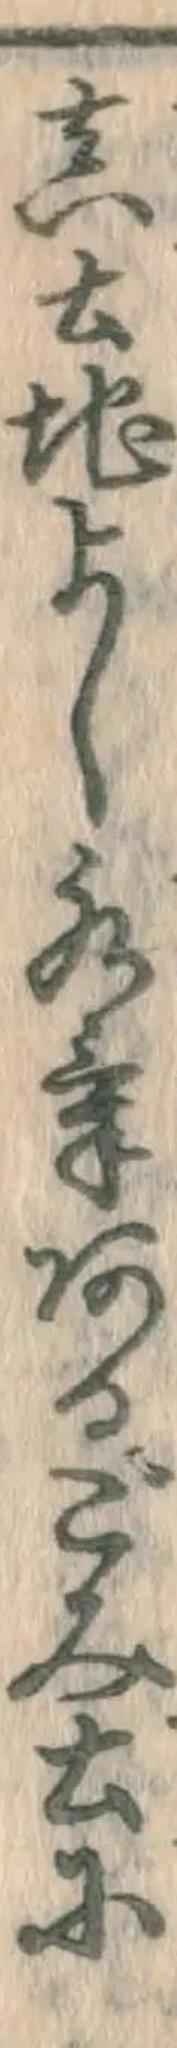真土地よし水気あるごみ土に
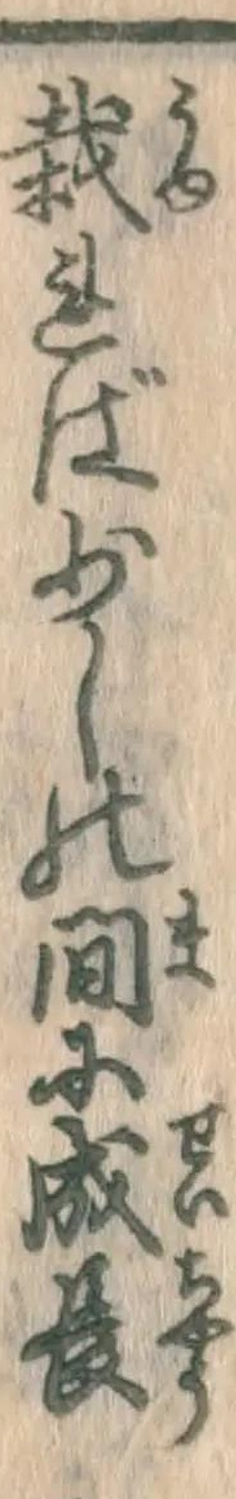栽れば少しの間に成長
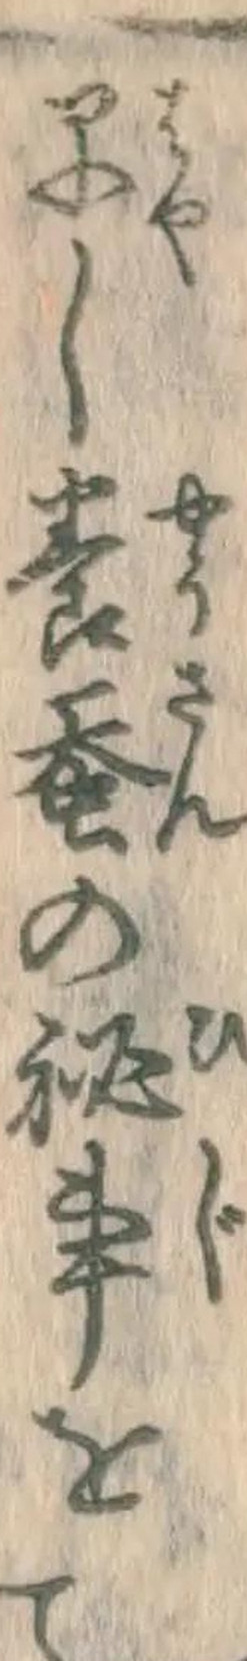早し養蚕の秘事を
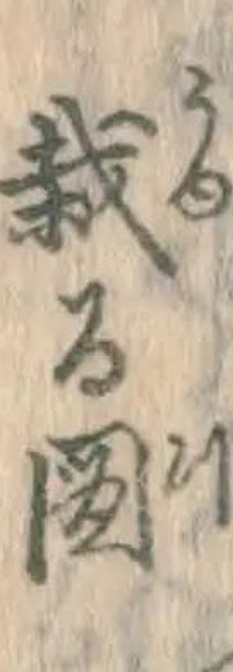栽る図
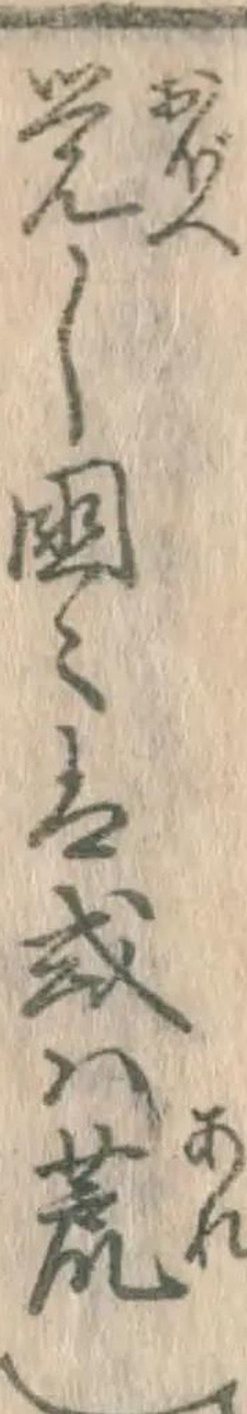覚し国々は或は荒
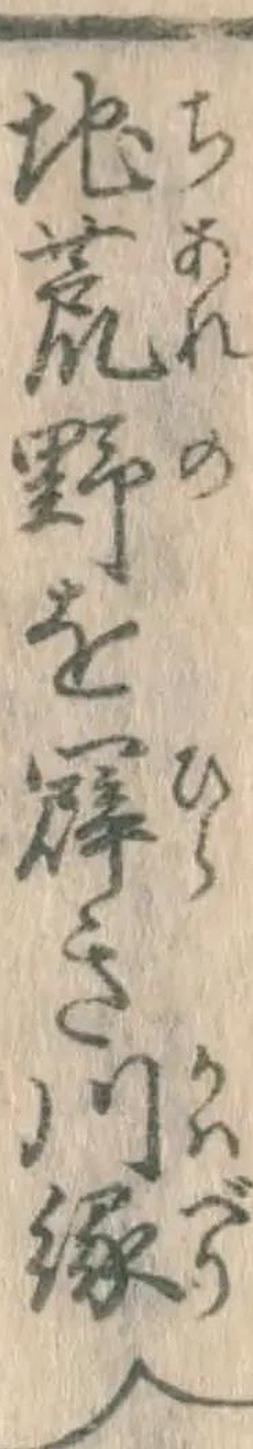地荒野を闢き川縁
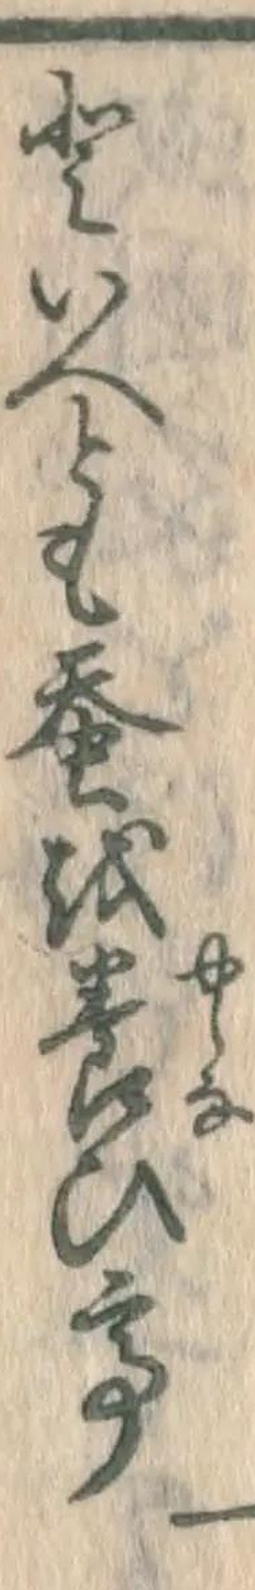といへとも蚕を養ひて
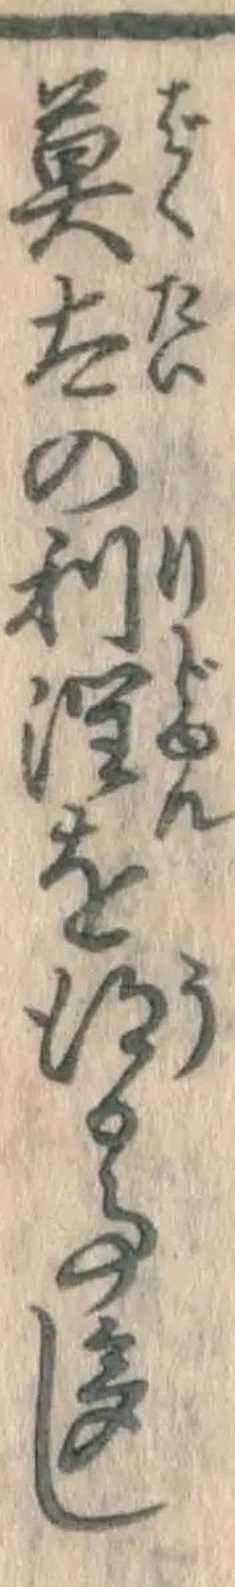莫太の利潤を得る事多し
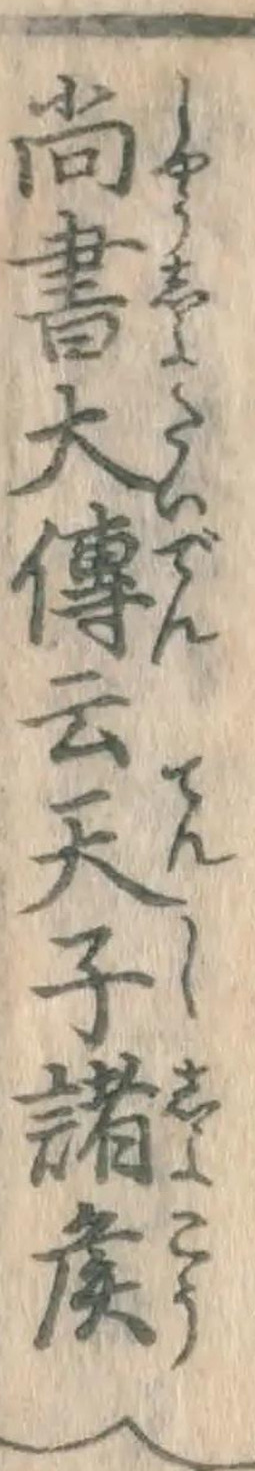尚書大伝云天子諸侯

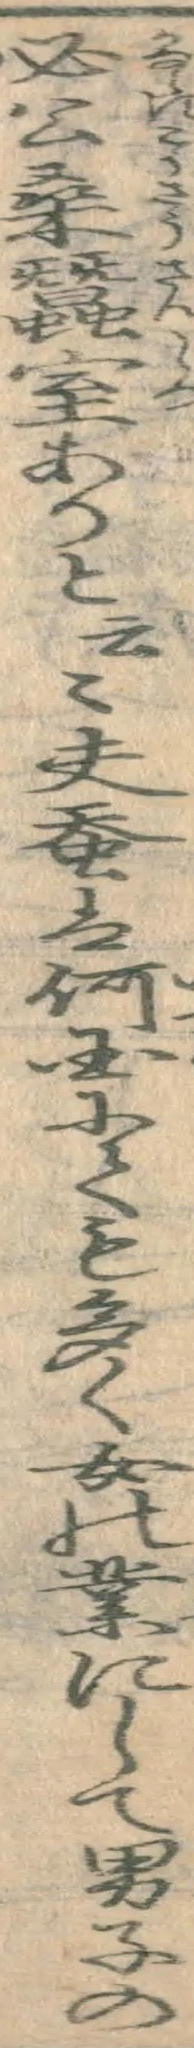必公桑蚕室ありと云々夫蚕は何国にても多く女の業にして男子の
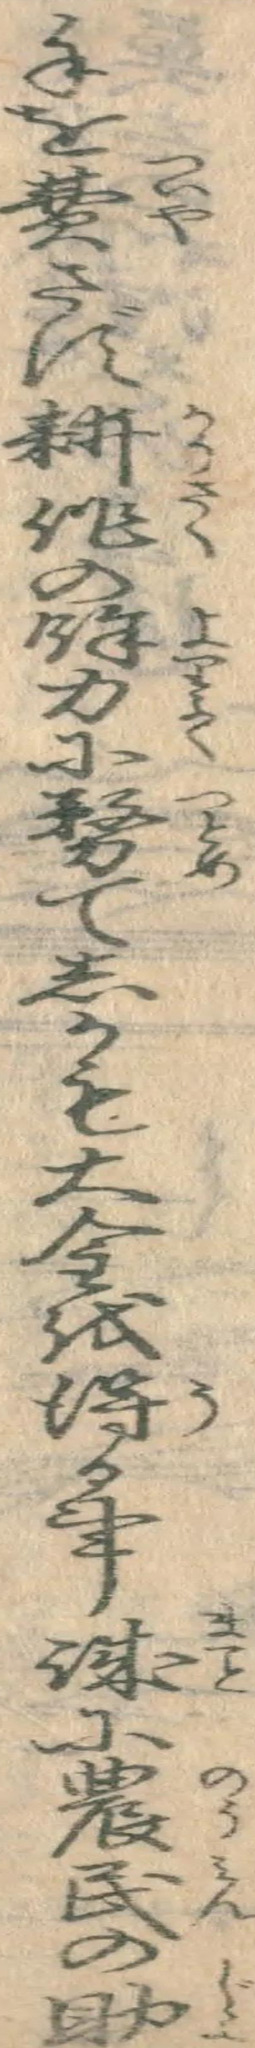手を費さず耕作の余力に務てしかも大金を得る事誠に農民の助
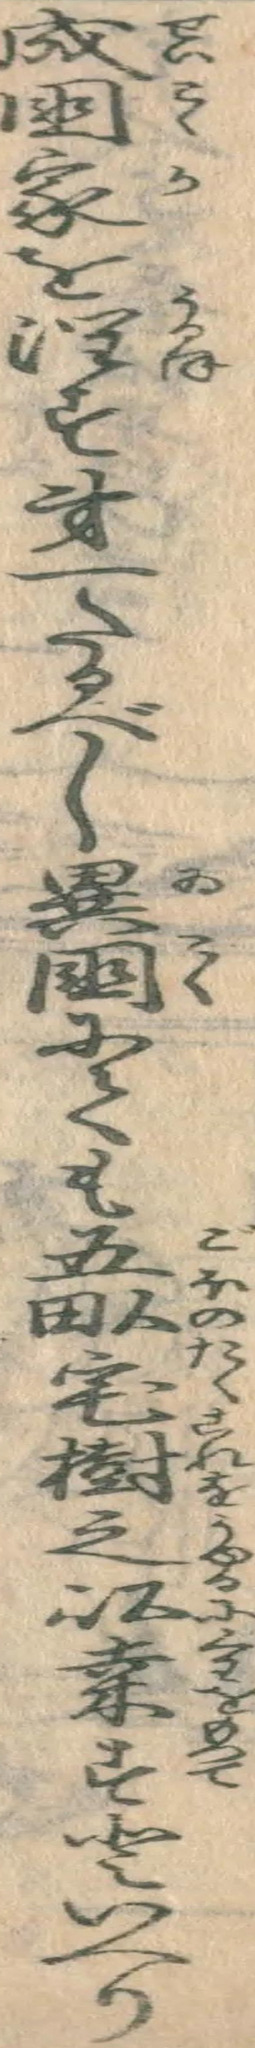成国家を潤す第一たるべし異国にても五畝宅樹之以桑すといへり
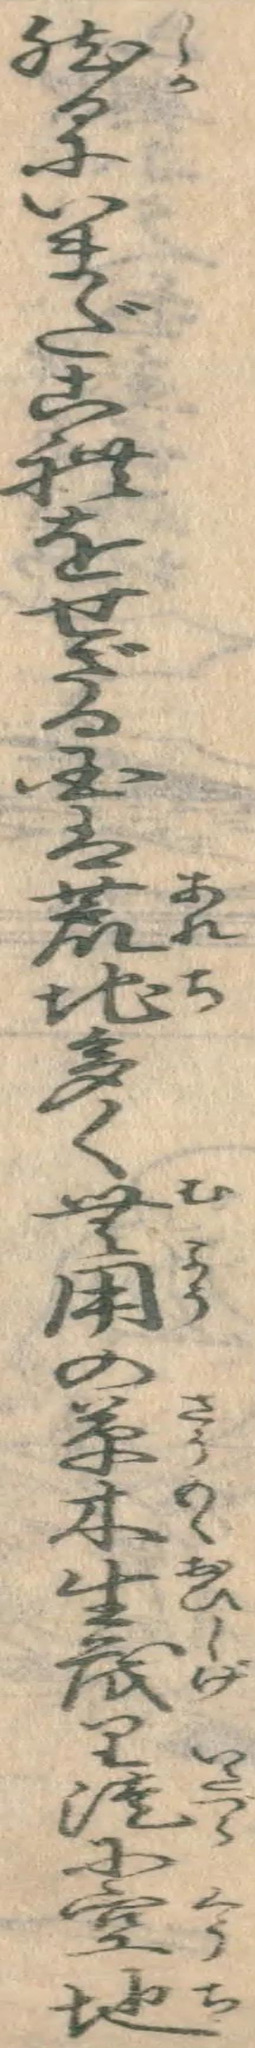然るにいまだこれをせざる国は荒地多く無用の草木生茂り徒に空地
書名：養蚕秘録 3巻. [1]
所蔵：国立国会図書館 National Diet Library, JAPAN
